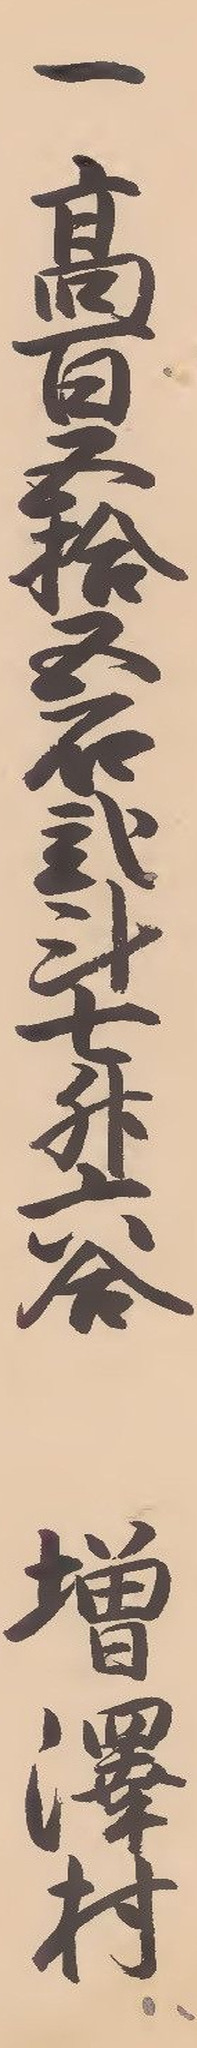一高百五拾五石弐斗七升六合増沢村
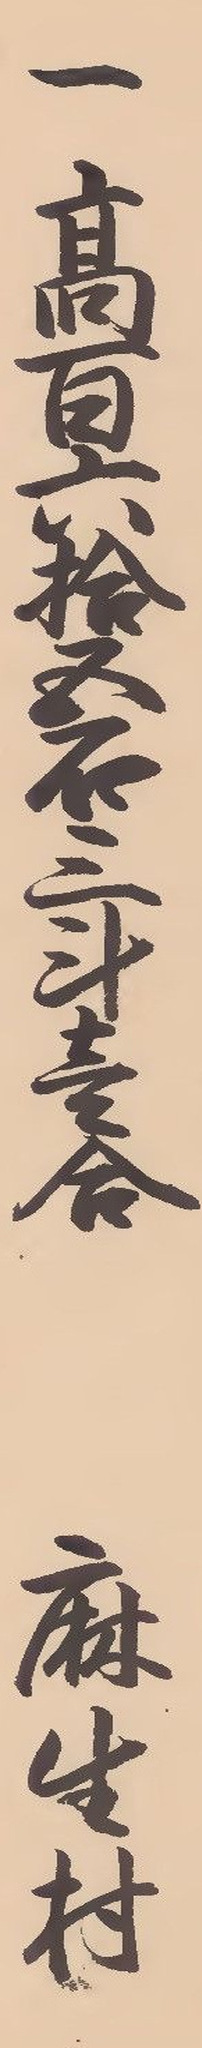一高百六拾五石三斗壱合麻生村
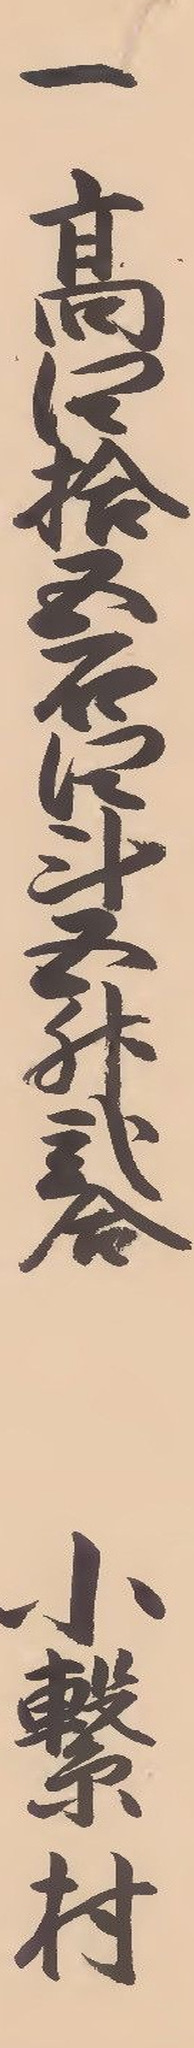一高四拾五石四斗五升弐合小繋村
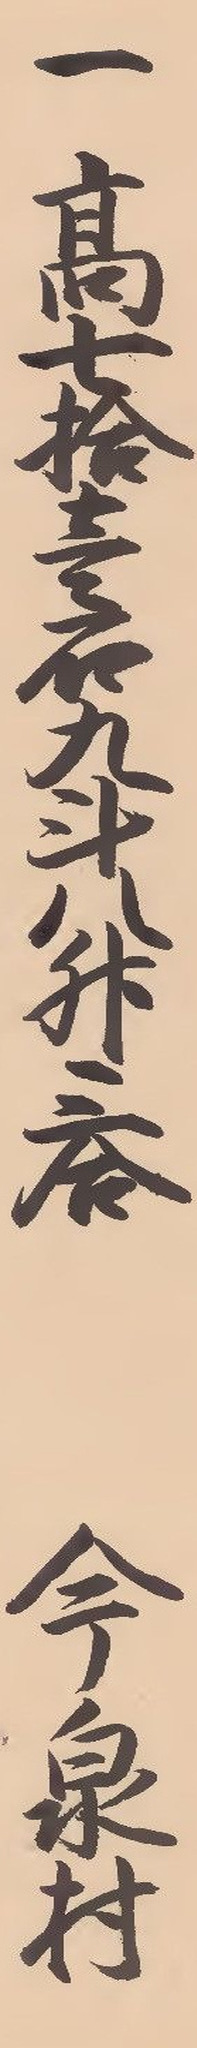一高七拾壱石九斗八升三合今泉村
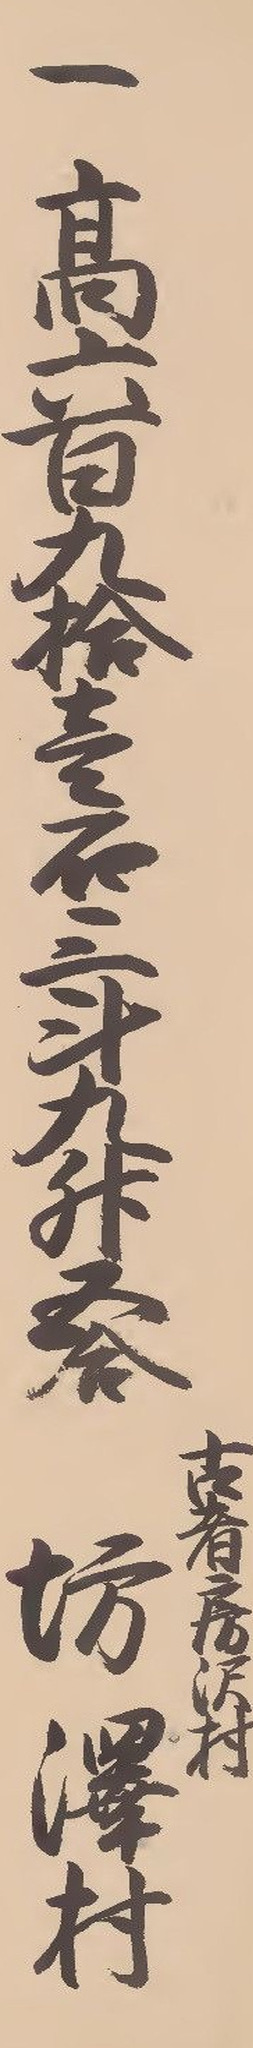一高六百九拾壱石三斗九升五合坊沢村
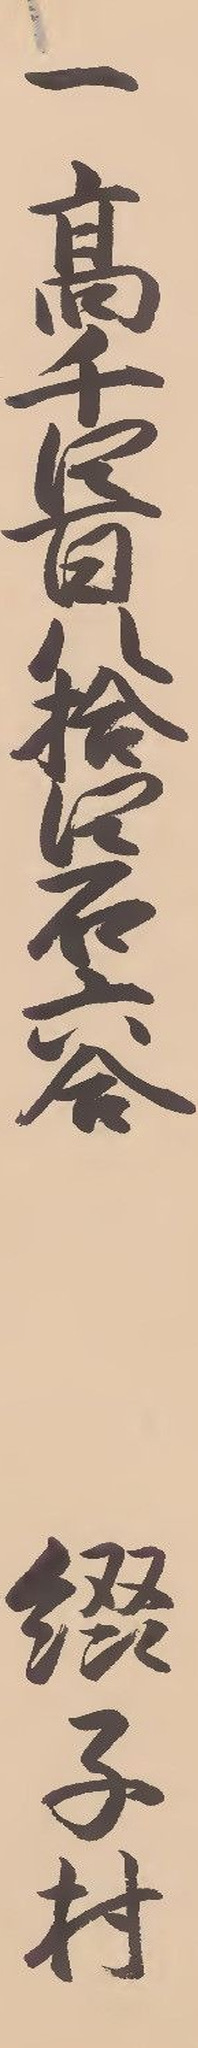一高千四百八拾四石六合綴子村
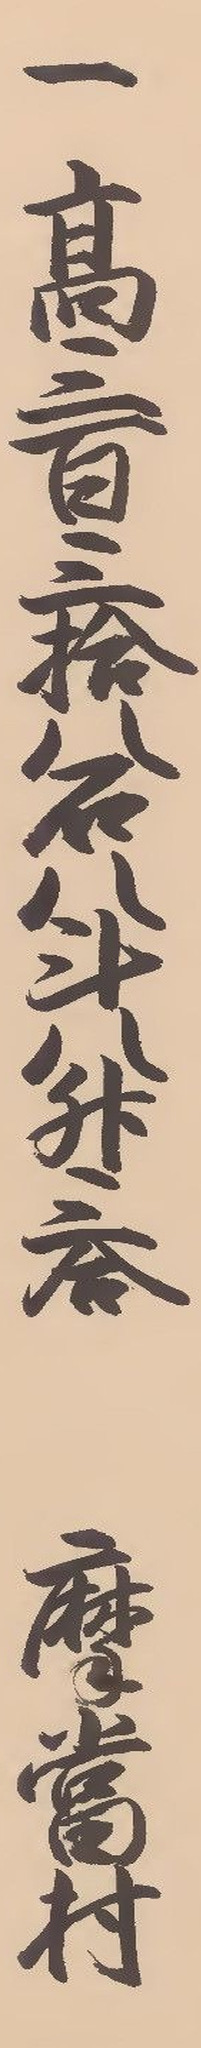一高三百三拾八石八斗八升三合摩当村
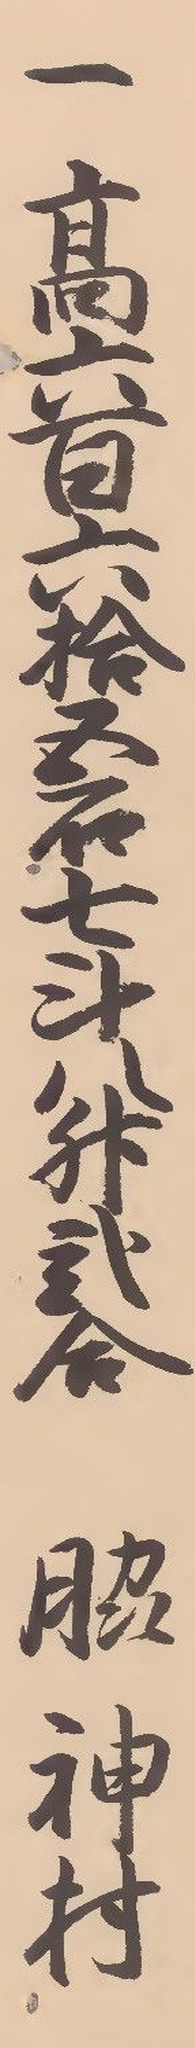一高六百六拾五石七斗八升弐合脇神村

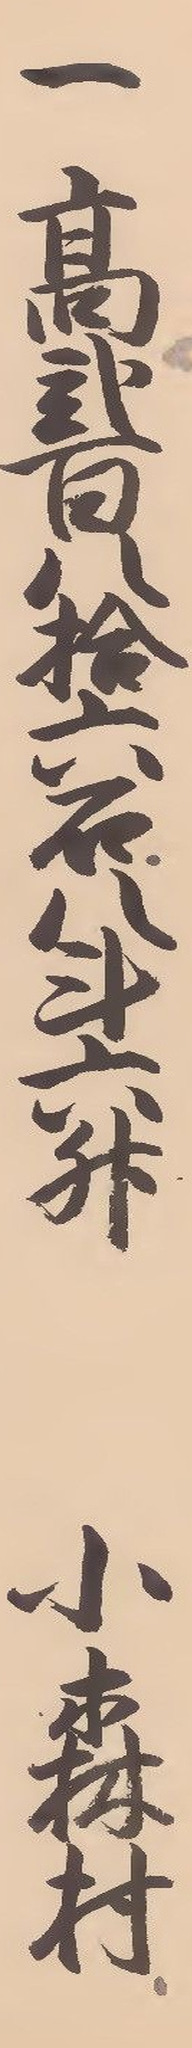一高弐百八拾六石八斗六升小森村
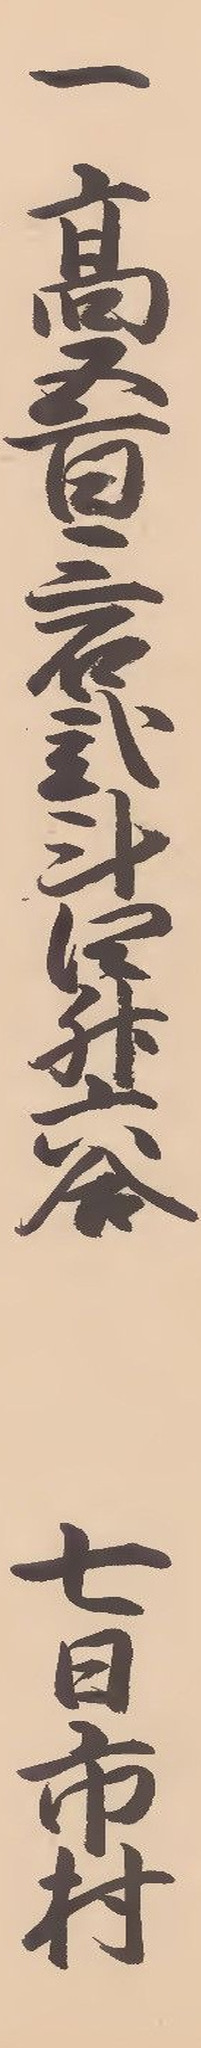一高五百三石弐斗四升六合七日市村
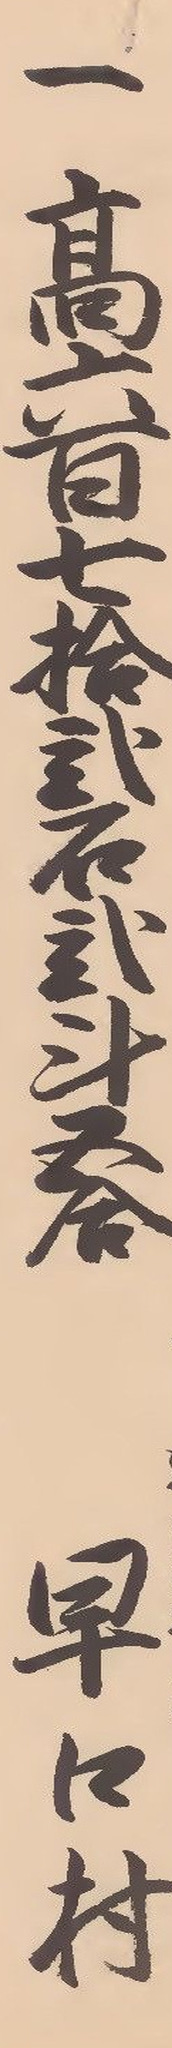一高六百七拾弐石弐斗五合早口村
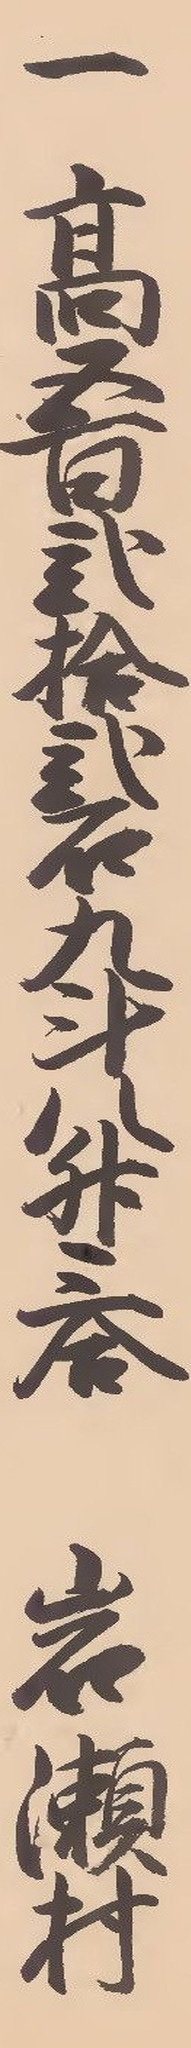一高五百弐拾弐石九斗八升三合岩瀬村
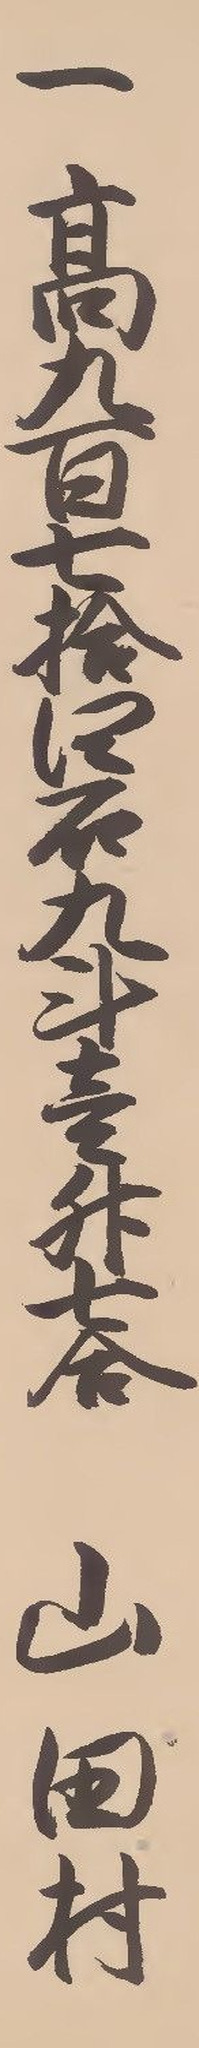一高九百七拾四石九斗壱升七合山田村
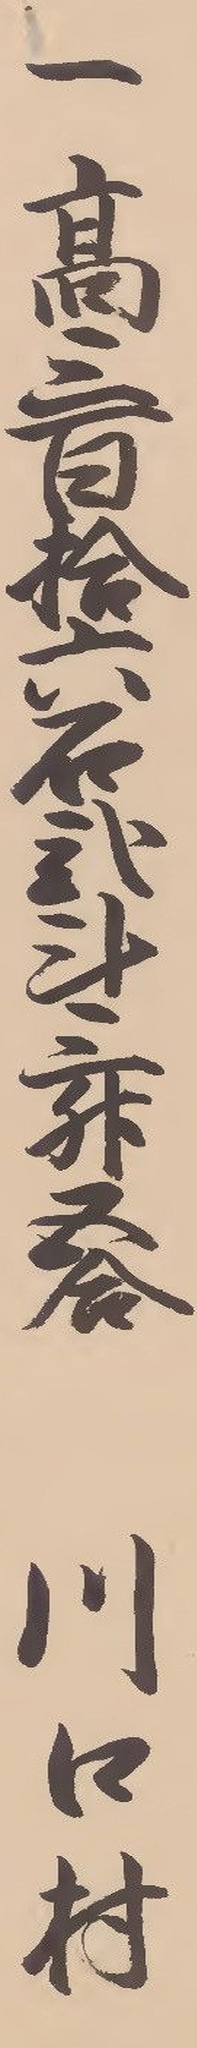一高三百拾六石弐斗三升五合川口村
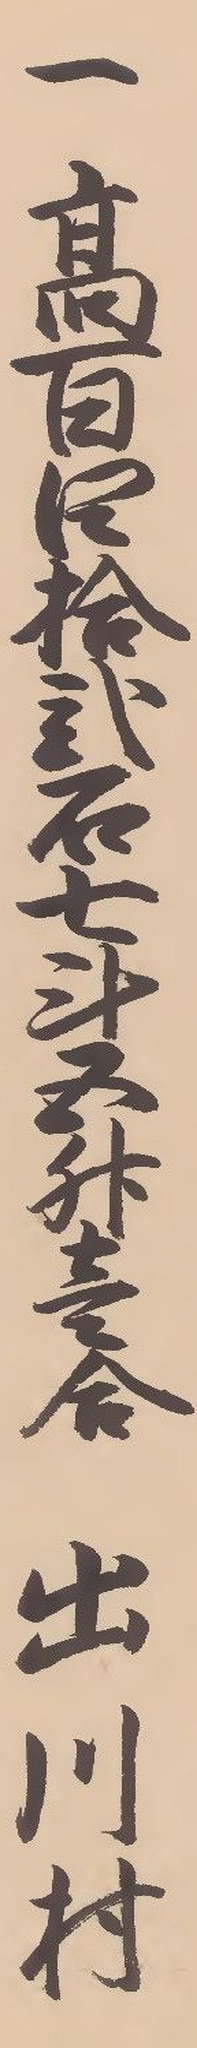一高百四拾弐石七斗五升壱合出川村
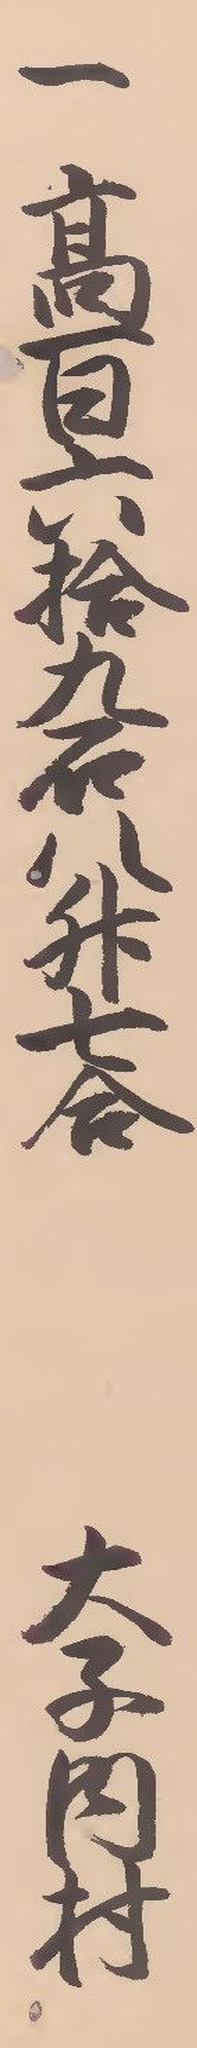一高百六拾九石八升七合大子内村
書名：出羽国郷帳　５
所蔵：国立公文書館 National Archives of Japan
